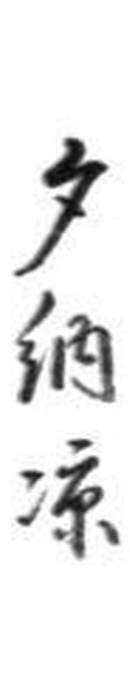夕納涼
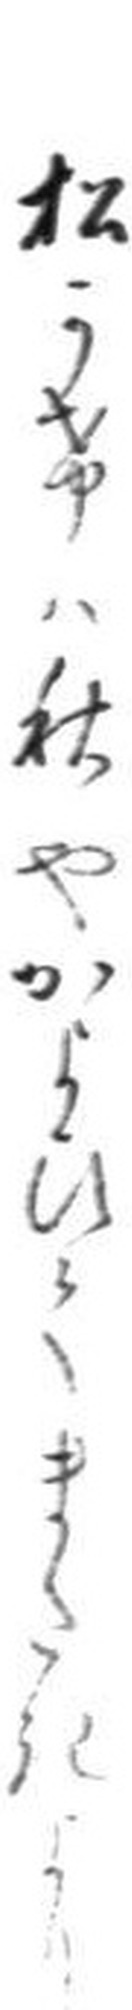松かけは秋やかよひてまたきより
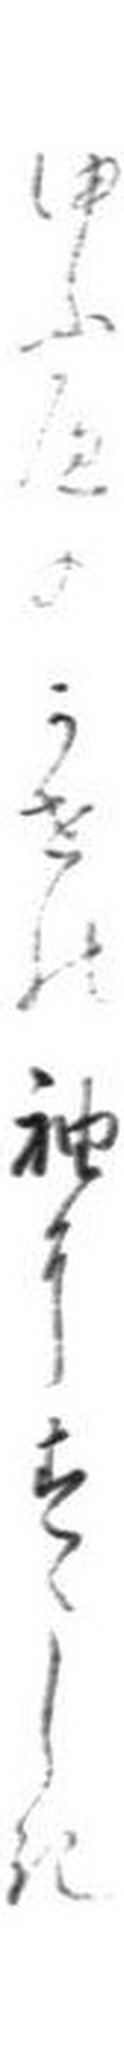ゆふへのかせの袖にすゝしき
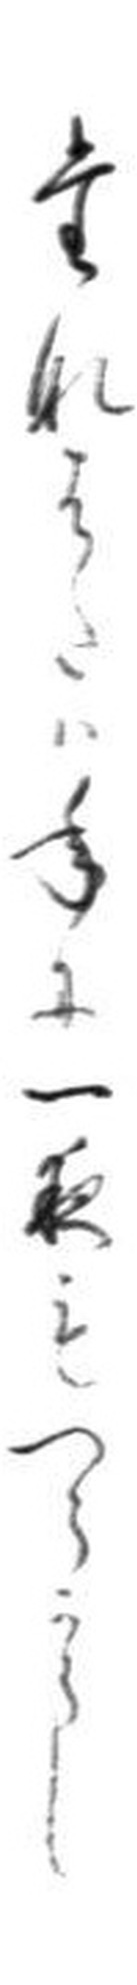たなはたは年に一夜もつらからし
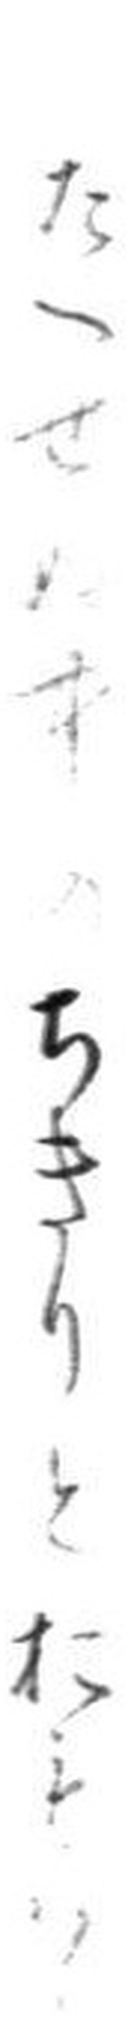たへせぬ中のちきりとおもはゝ

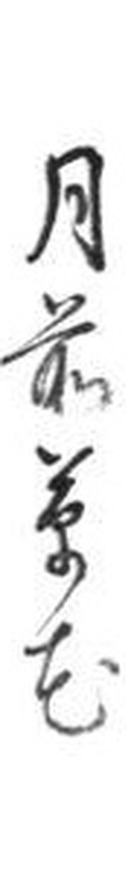月前草花
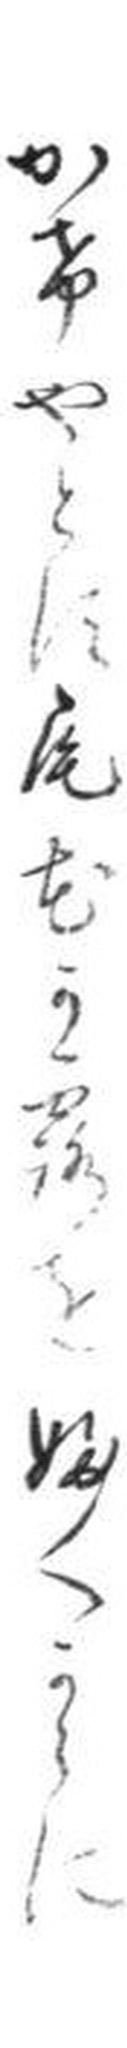かけやとす尾花か露をふくからに
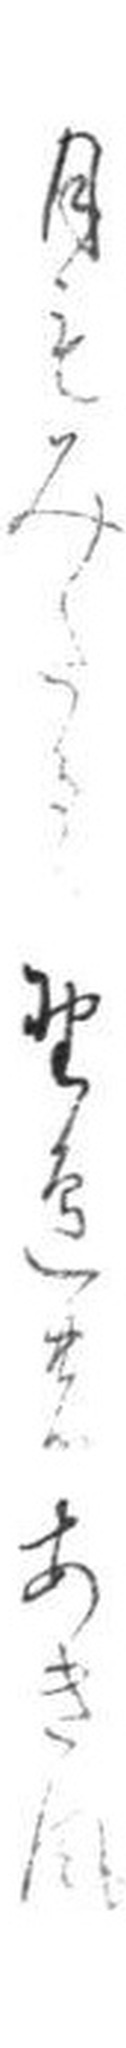月もみたるゝ野辺のあき風
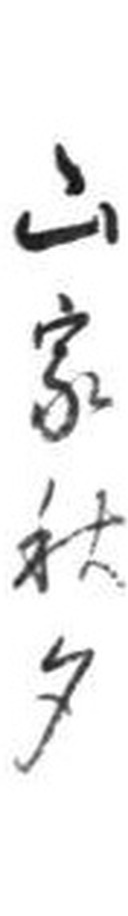山家秋夕
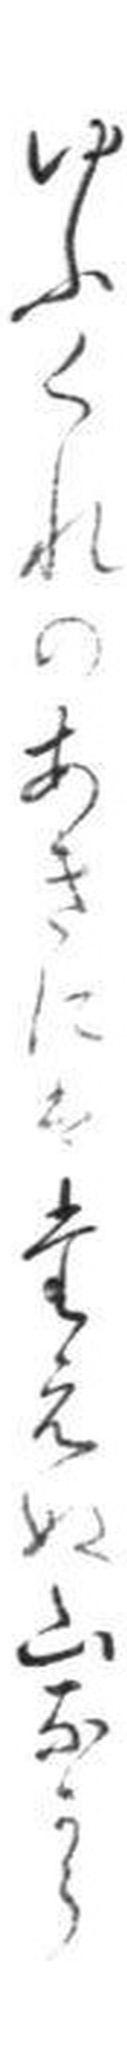ゆふくれのあきにはたえぬ山なから
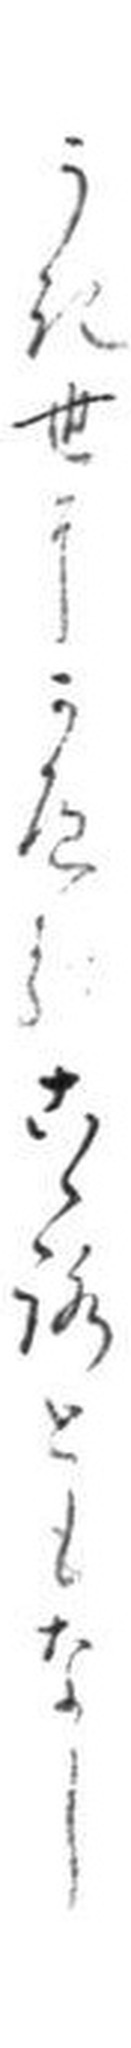うき世にかへるこゝろともなし
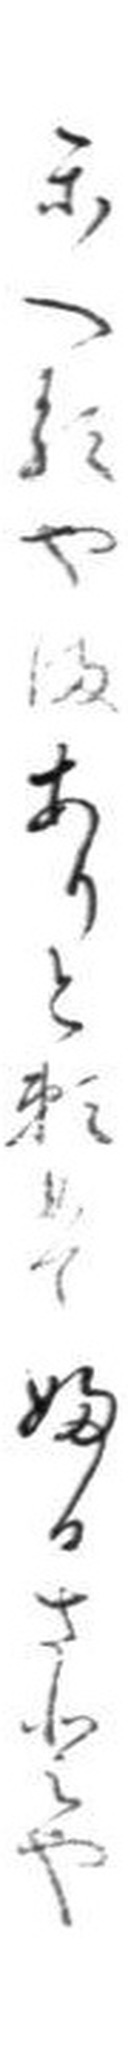かへるやまありと頼みてふるさとや
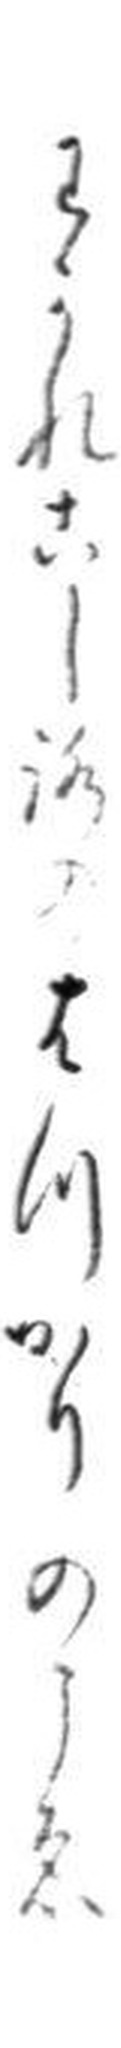わかれこし路のはつかりのこゑ
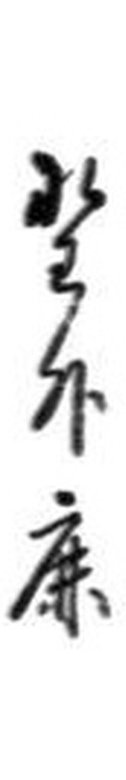野外鹿
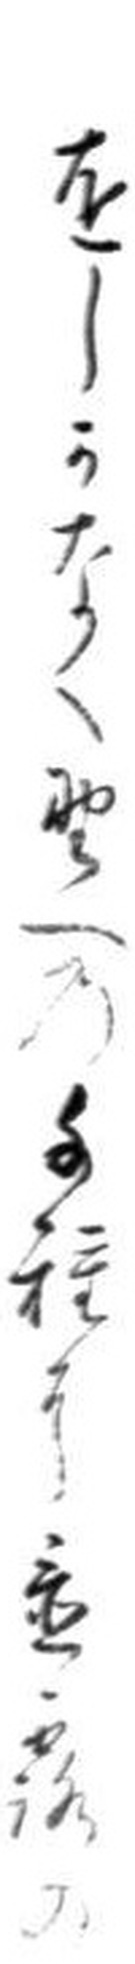をしかなく野への千種に置露の
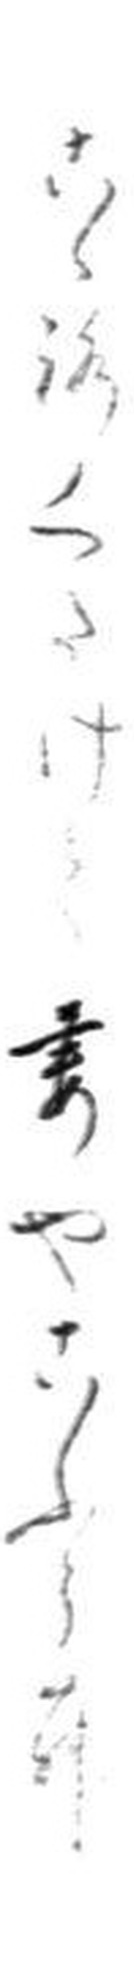こゝろくたけて妻やこふらむ
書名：家譜 八 光通公 従寛文十年到同十二年
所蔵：福井県文書館 Fukui Prefectural Archives
